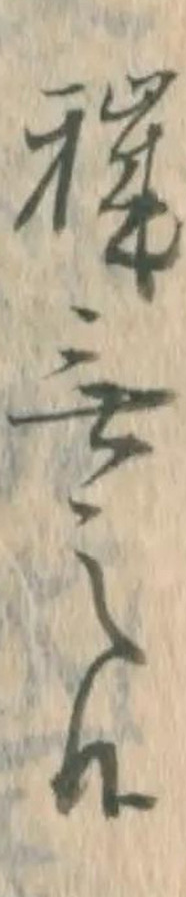穢無之候
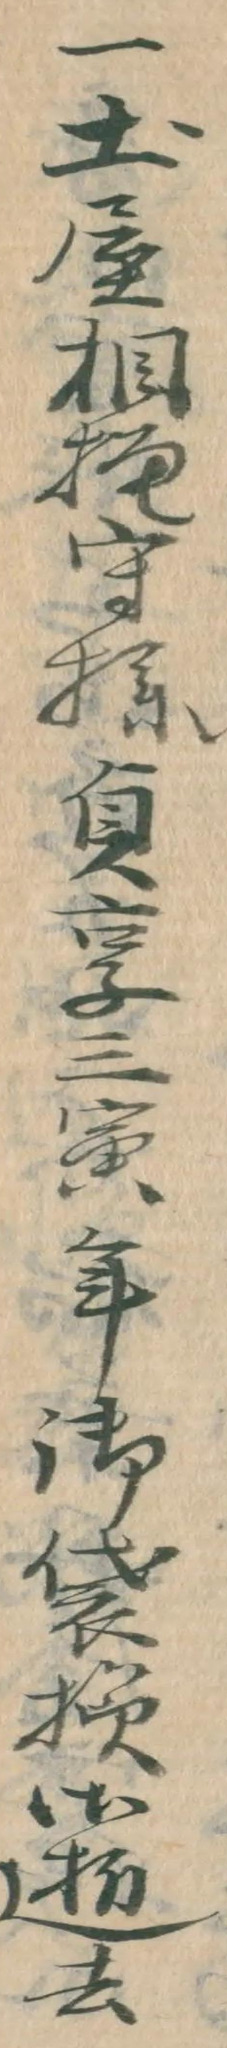一土屋相模守様貞享三寅年御袋様御逝去

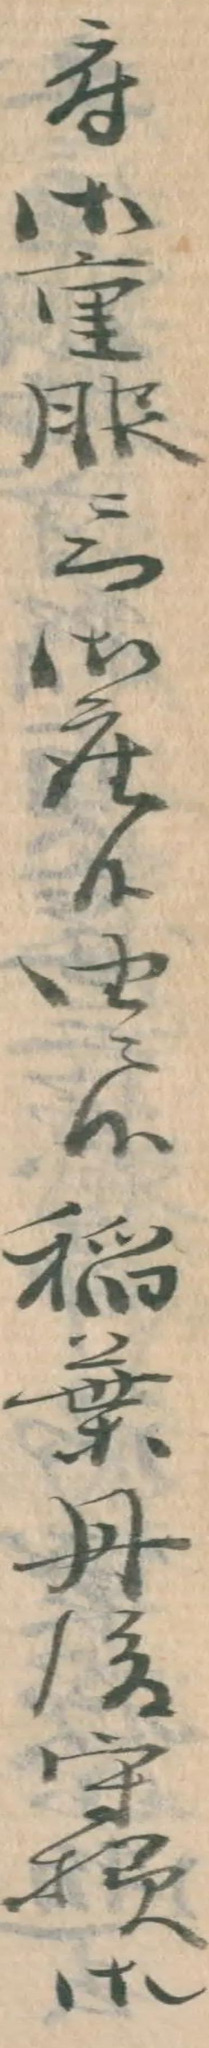ニ付御重服ニ而御座候由ニ候稲葉丹後守様御
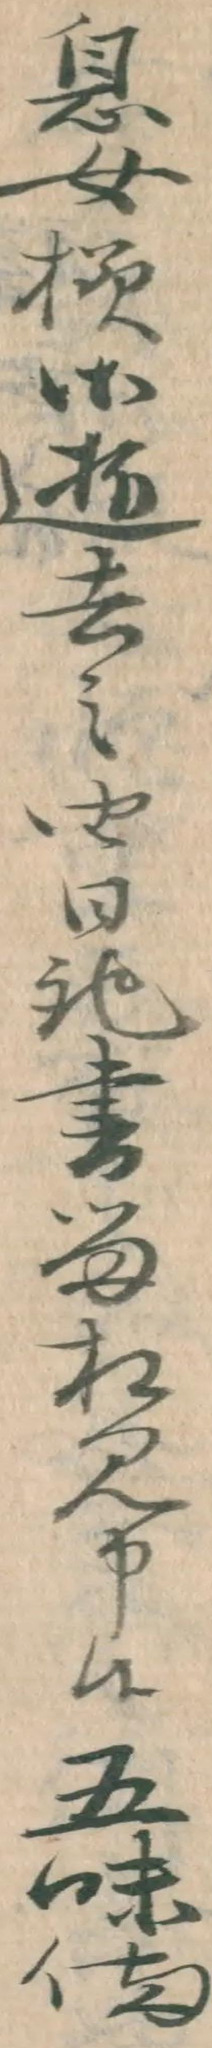息女様御逝去之由日記書留相見申候五味備
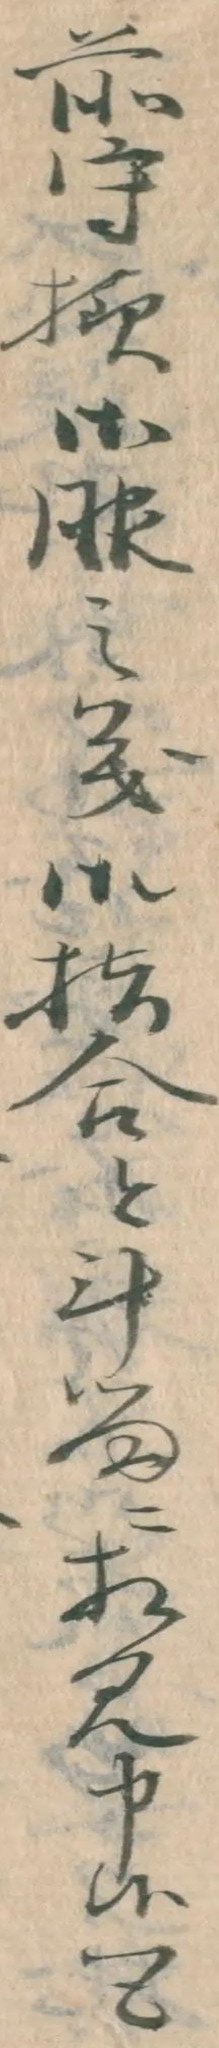前守様御服之義御指合と計留ニ相見申候以上
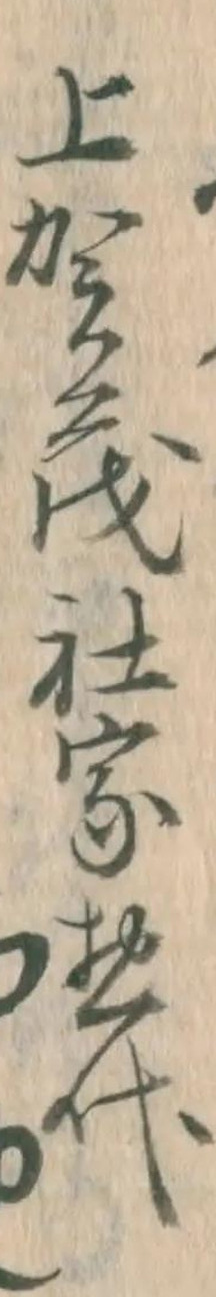上賀茂社家惣代
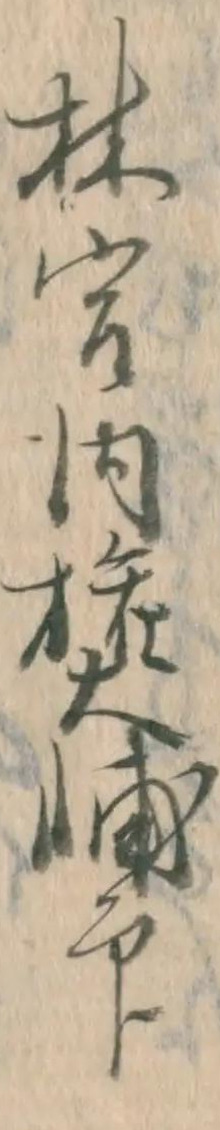林宮内権大輔印
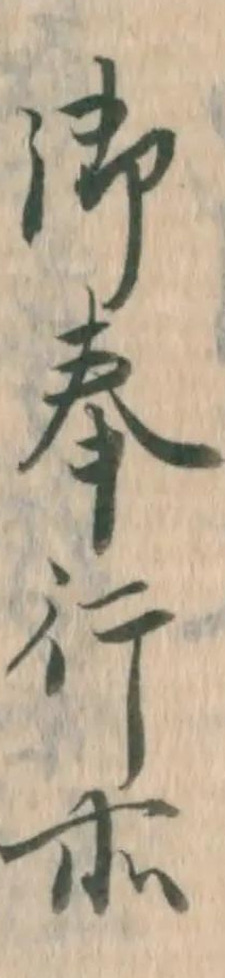御奉行所
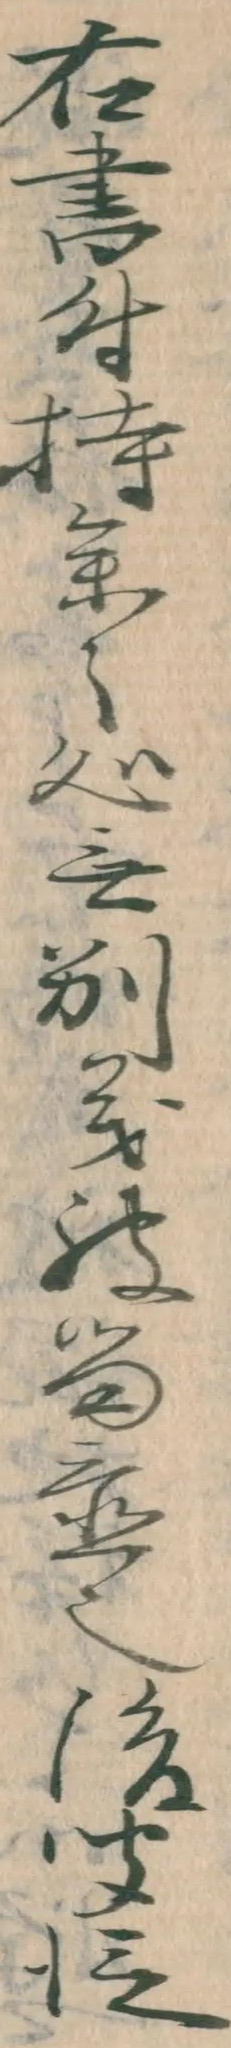右書付持参之処無別義致留置也後聞従
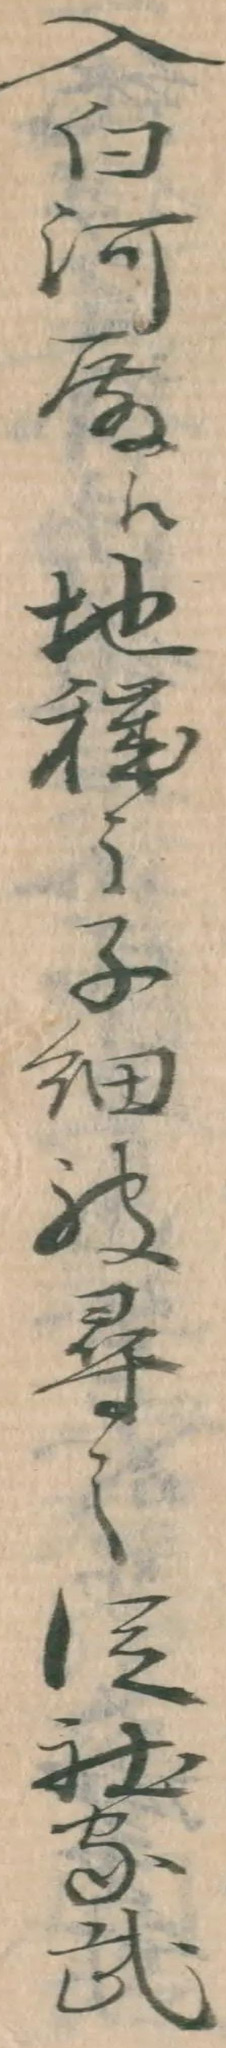入白河殿江地穢之子細被尋之従社家武
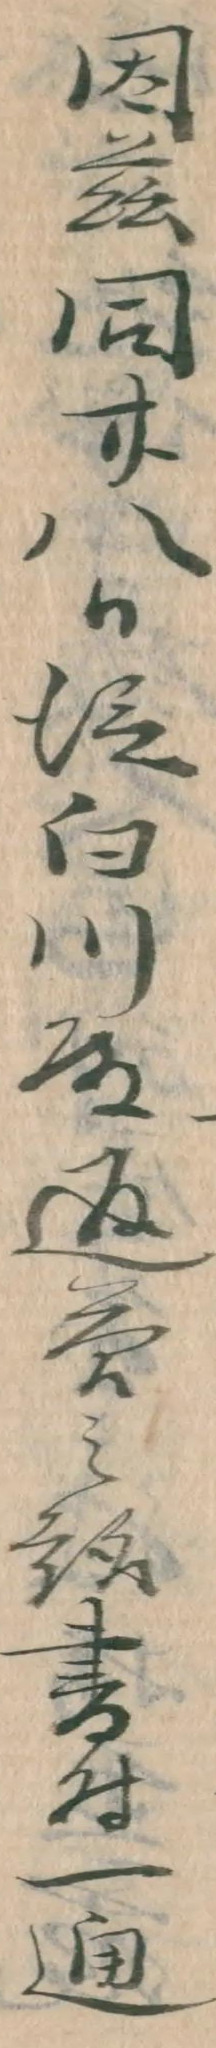因茲同廿八日従白川殿返答之趣書付一通
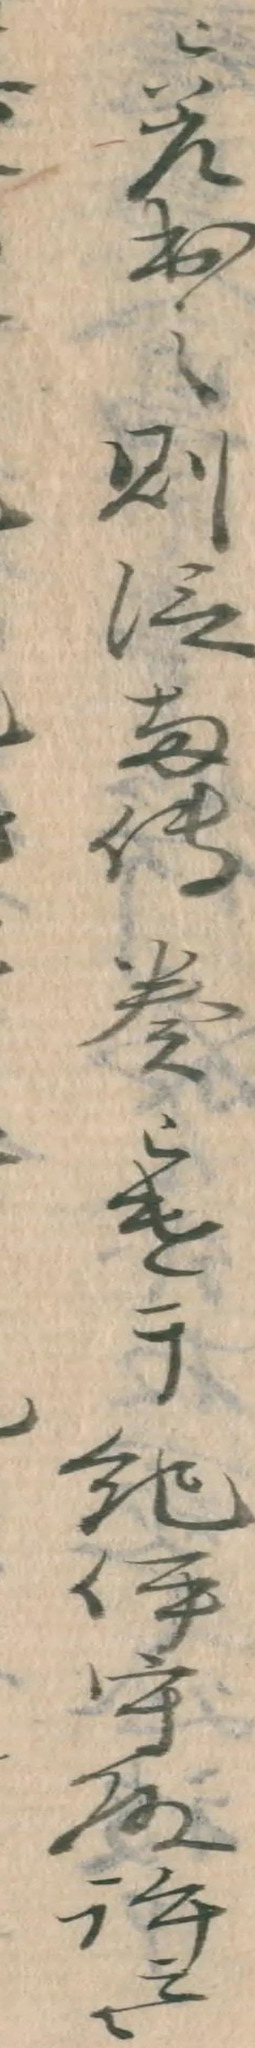被差出之則従両伝奏被遣于紀伊守殿許云々
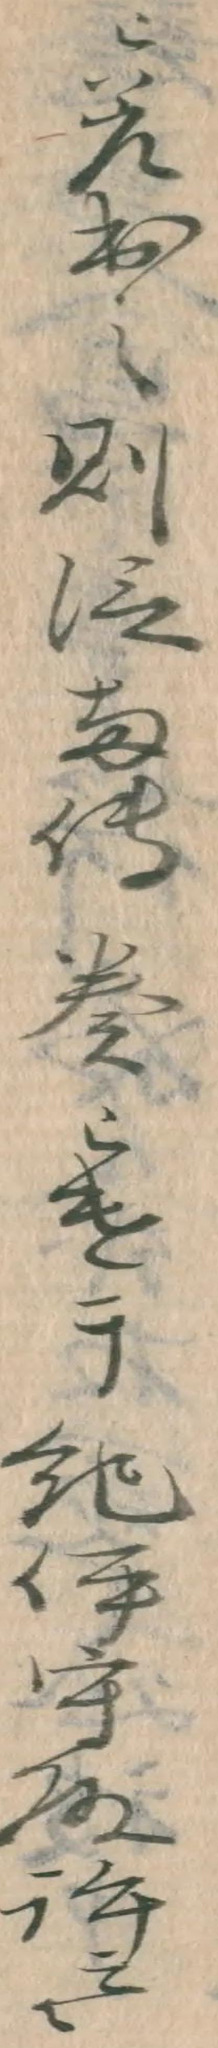被差出之則従両伝奏被遣于紀伊守殿許云々
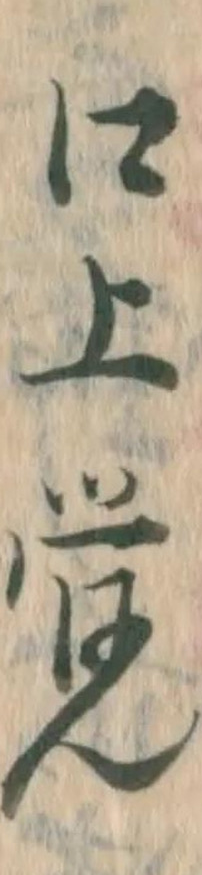口上覚
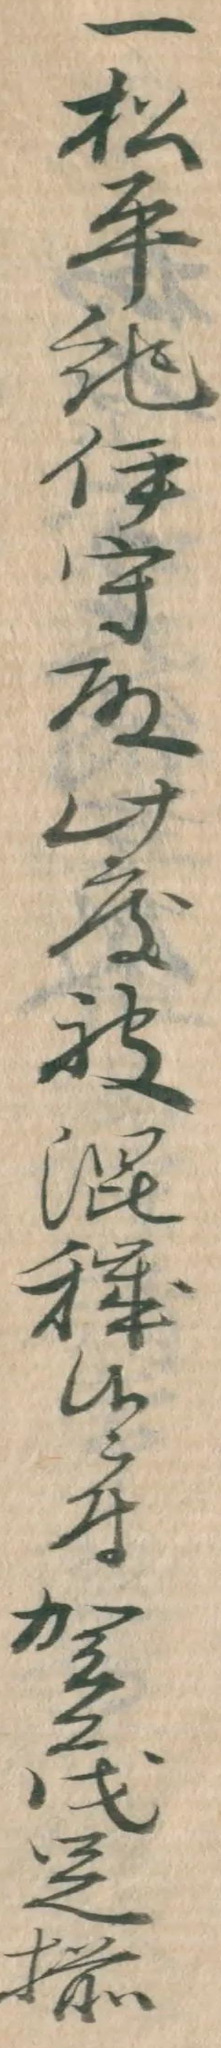一松平紀伊守殿此度被混穢候ニ付賀茂足揃
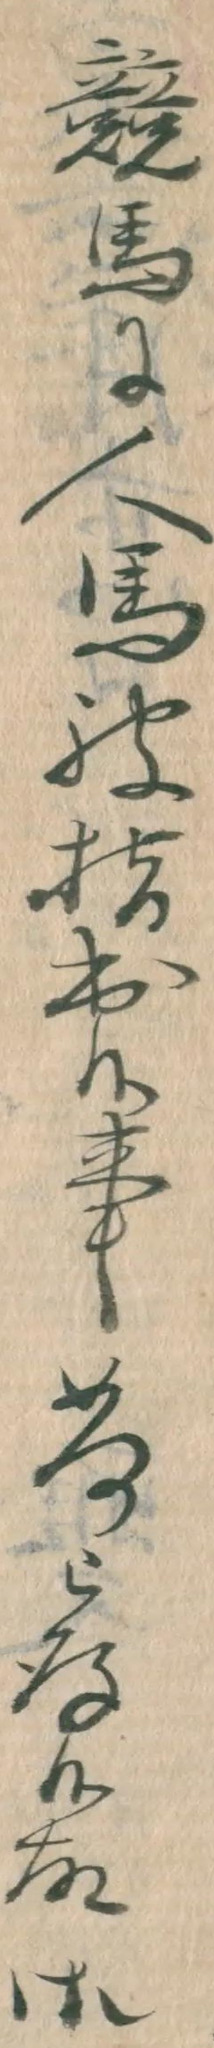競馬に人馬被指出候事如何被存候故御
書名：賀茂社記録. 第10冊
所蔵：国立国会図書館 National Diet Library, JAPAN
